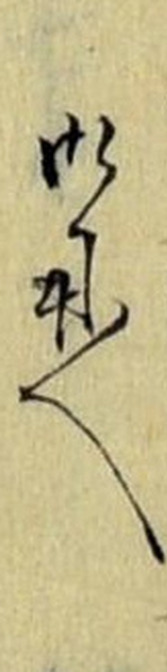御用人
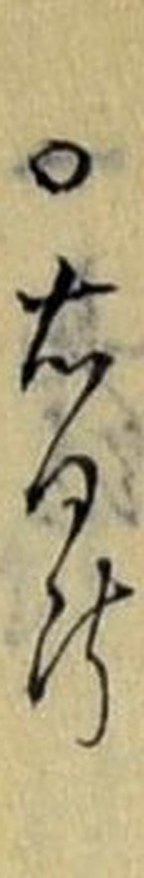○右同断
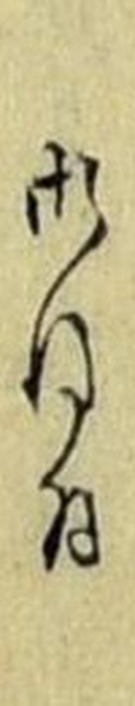御目付
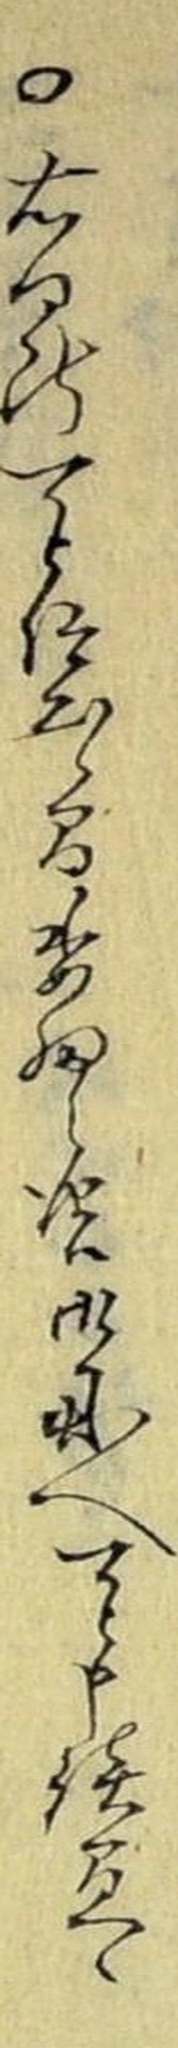○右同断可被仰出候間委細之儀は御用人可被申談宜候
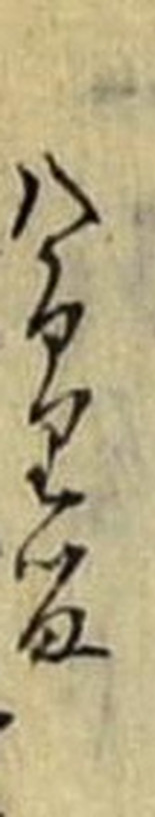八百里留
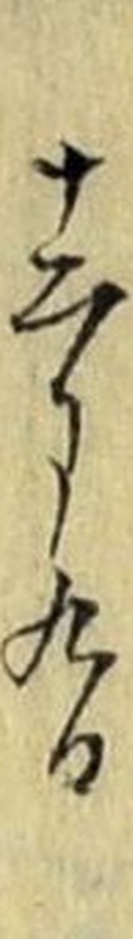十二月九日
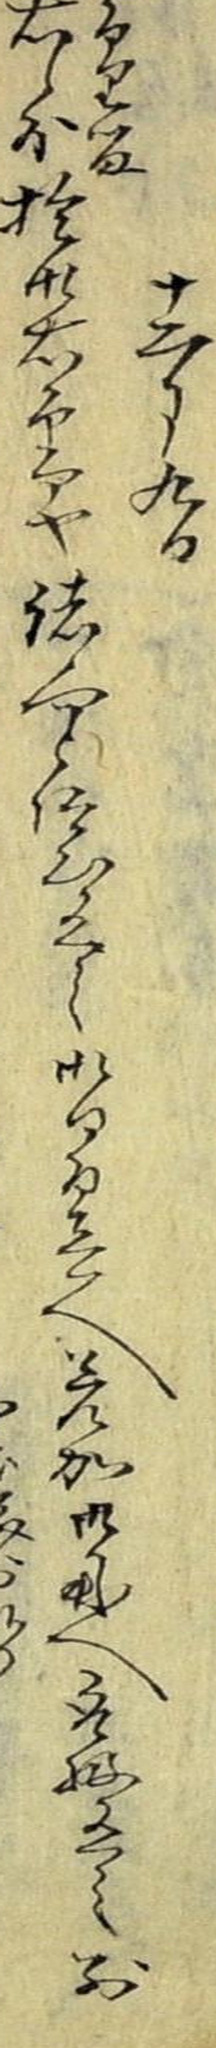右之外於御右筆部や諸向被仰出候有之御目付壱人差加御用人取扱有之別

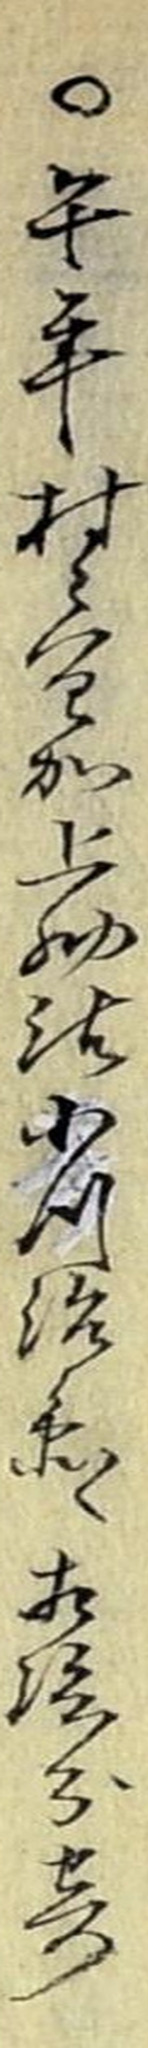○午年村々冥加上納銀小川治兵衛へ相渡分寄
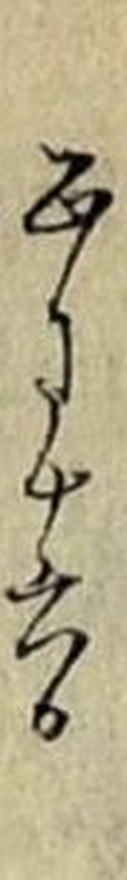正月十六日
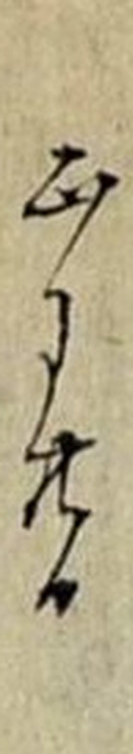正月廿日
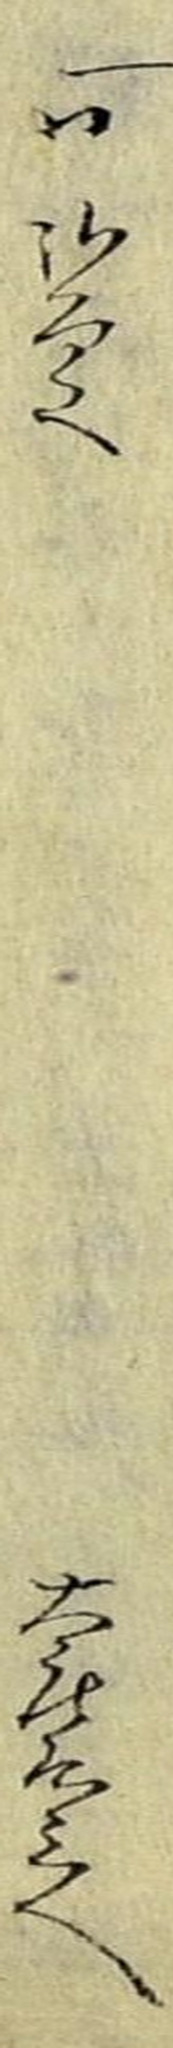同弐百匁大庄屋三人
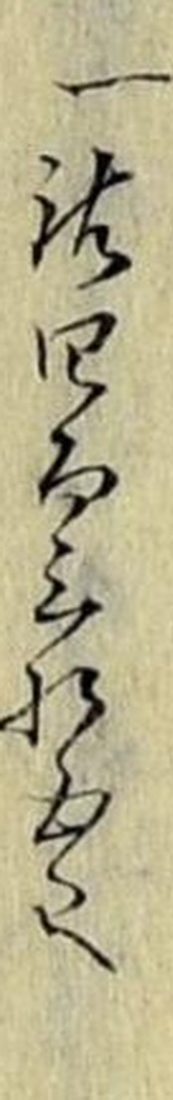銀四百三拾五匁
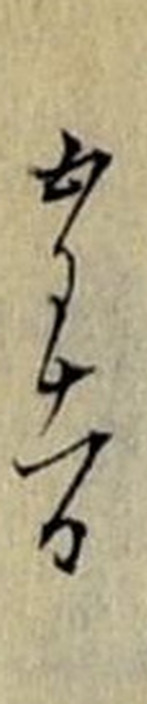五月十一日
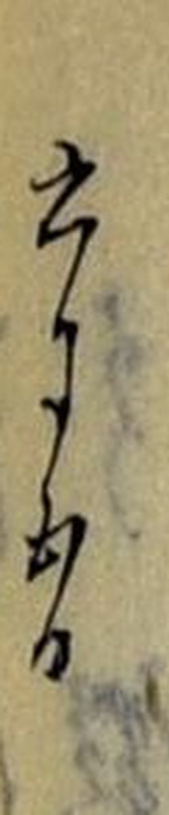六月五日
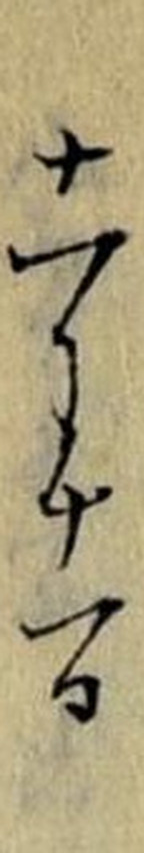十一月十一日
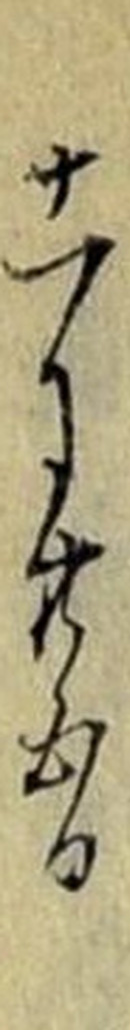十一月廿五日
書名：命令之部 六
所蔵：福井県文書館 Fukui Prefectural Archives
